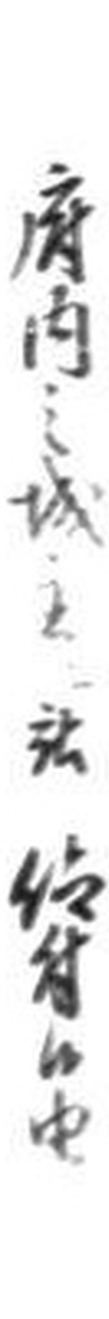府内之城主ニ被仰付候由
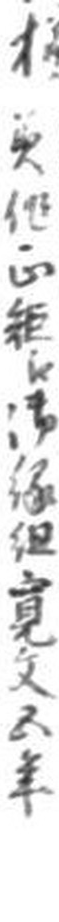美作正矩江御縁組寛文五年
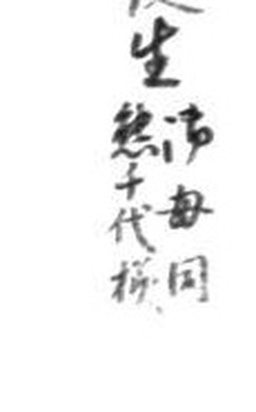熊千代様

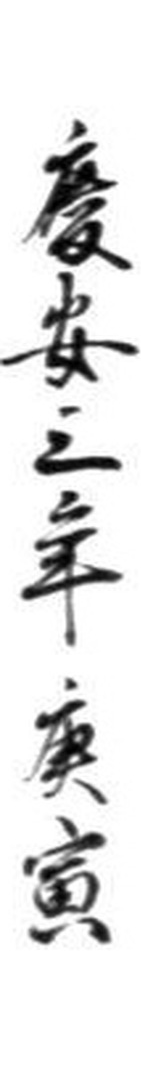慶安三年庚寅
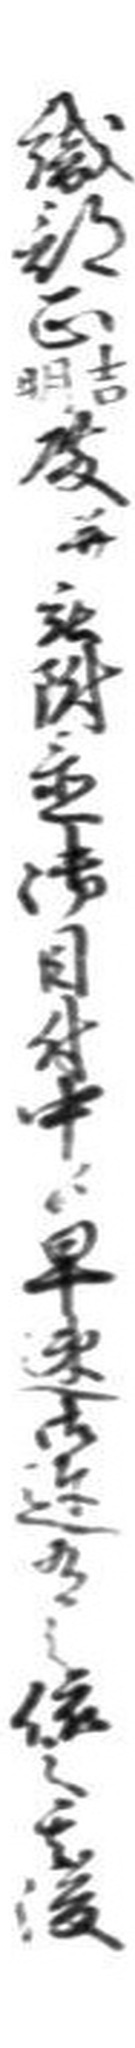明殿并被附置御目付中ゟ早速御達有之依之其後
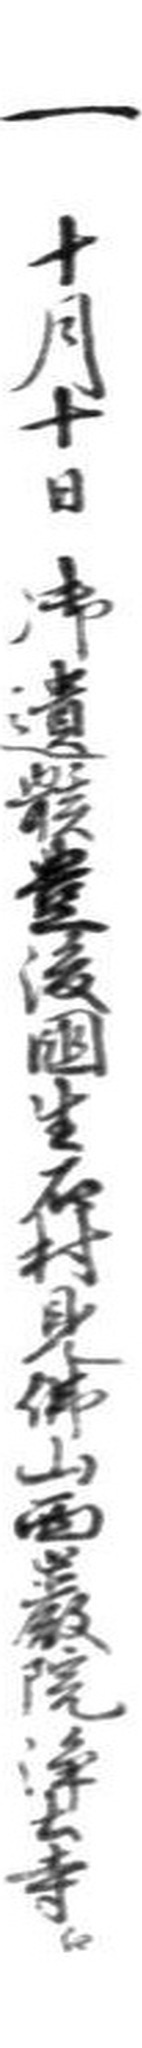一十月十日御遺骸豊後国生石村見仏山西厳院浄土寺江
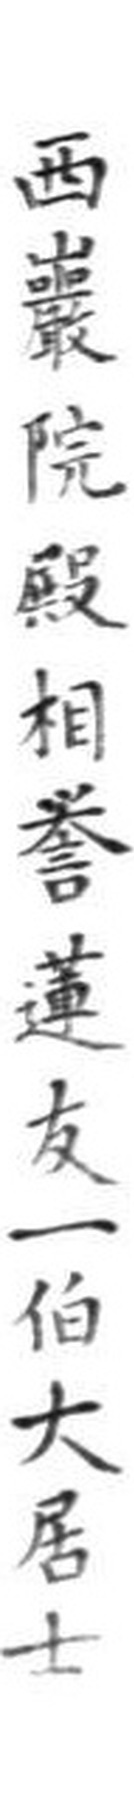西厳院殿相誉蓮友一伯大居士

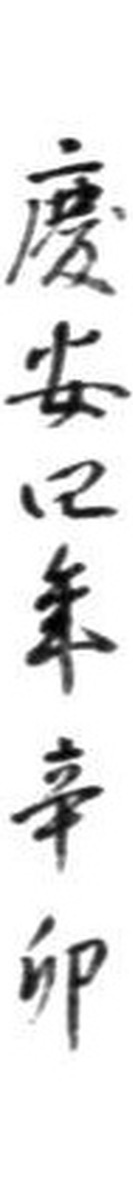慶安四年辛卯
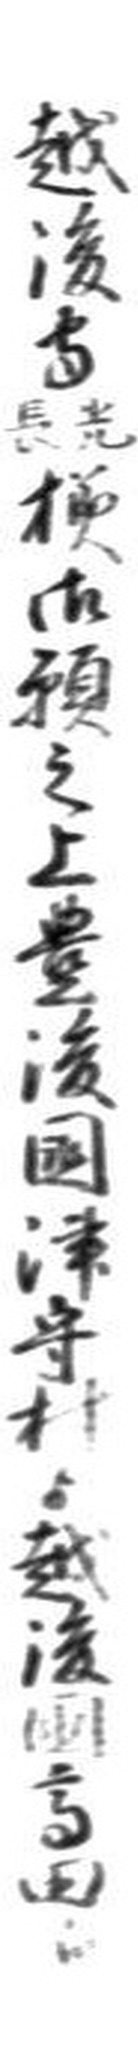長様御願之上豊後国津守村ゟ越後国高田江
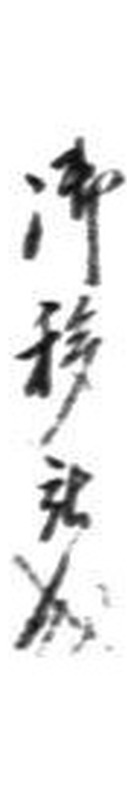御移被成

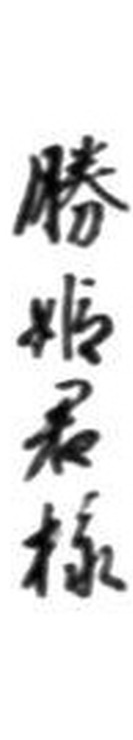勝姫君様
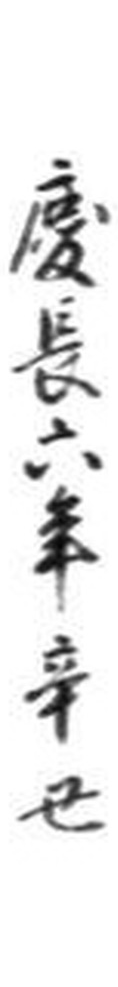慶長六年辛丑
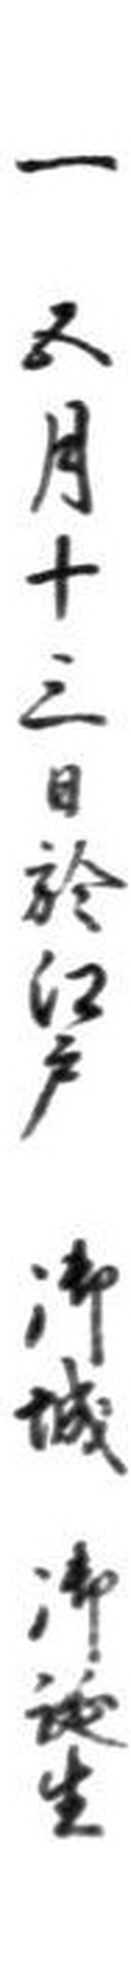一五月十三日於江戸御城御誕生
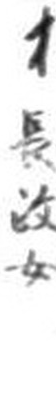長政女
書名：家譜 二 忠直公 従文禄四年到慶安四年
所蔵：福井県文書館 Fukui Prefectural Archives
